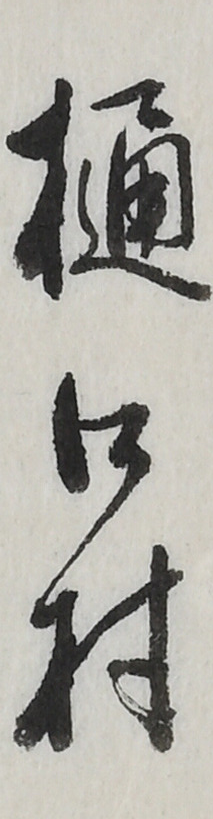樋口村
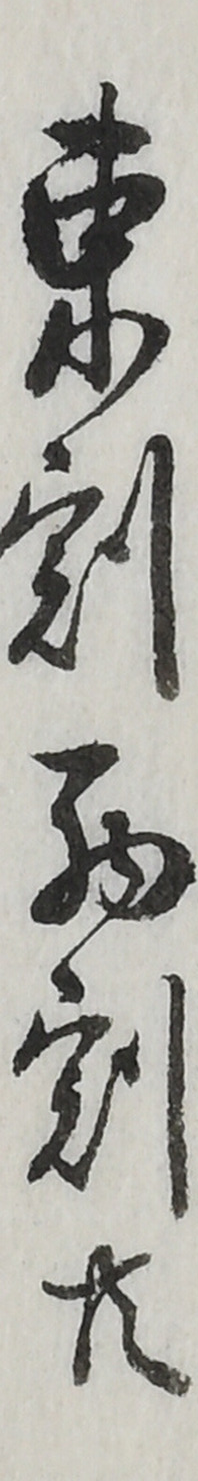東割西割共
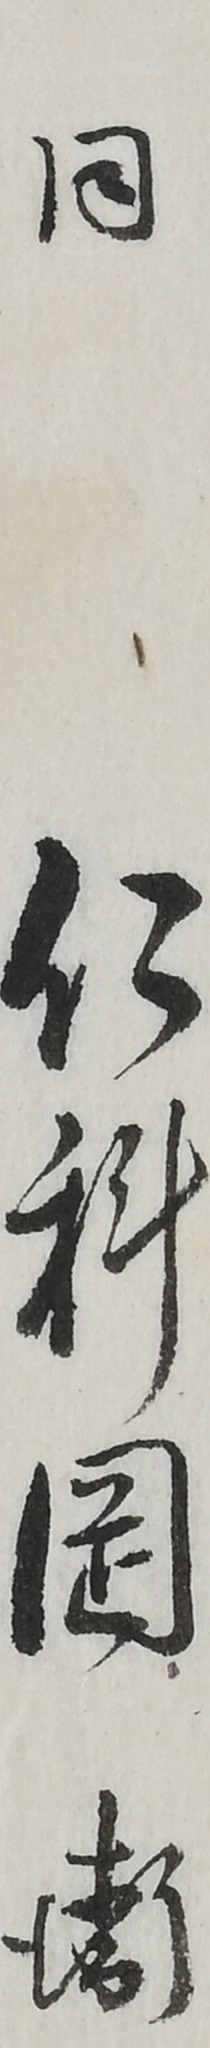同仁科岡衛
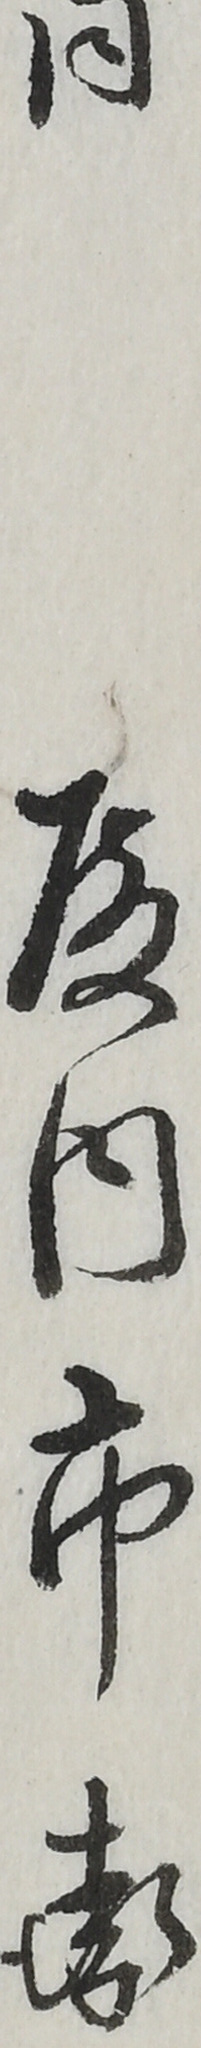同殿内市衛
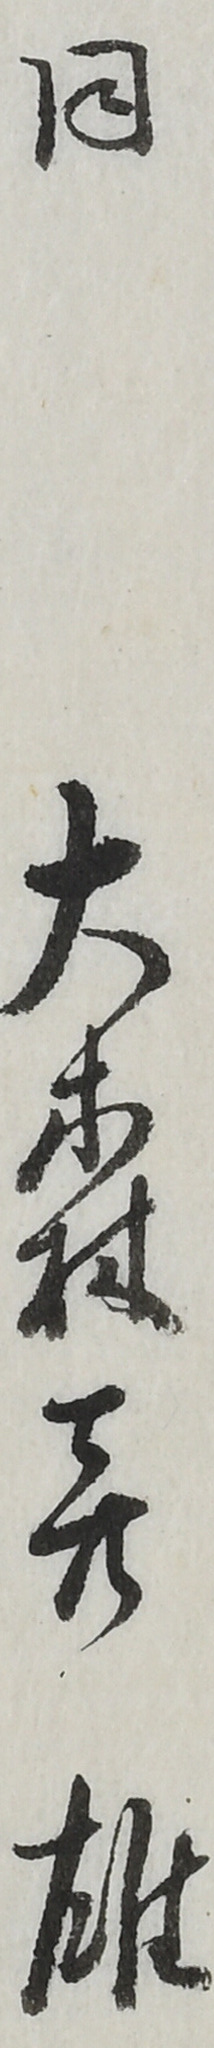同大森喜雄
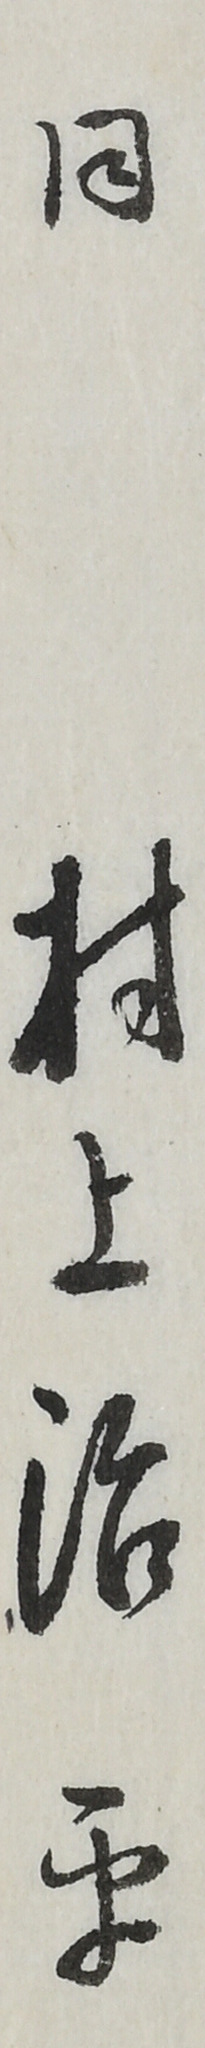同村上治平

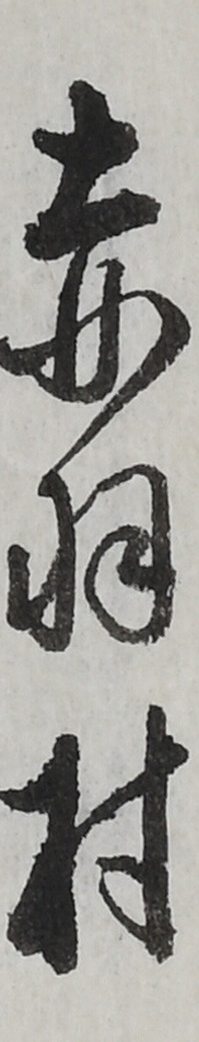赤羽村
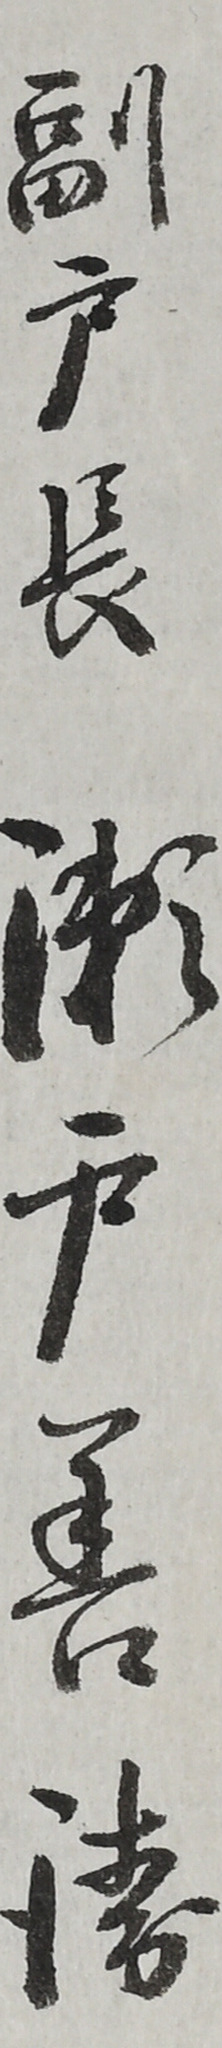副戸長瀬戸善衛
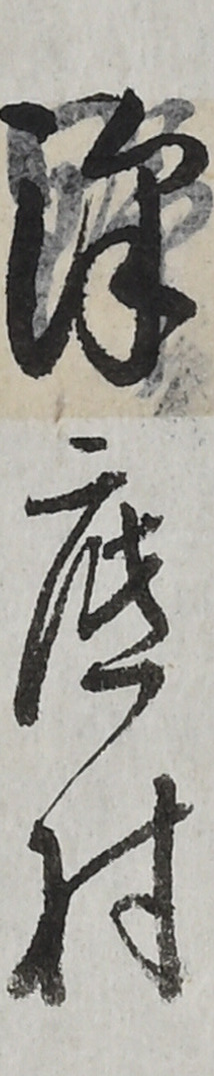澤底村
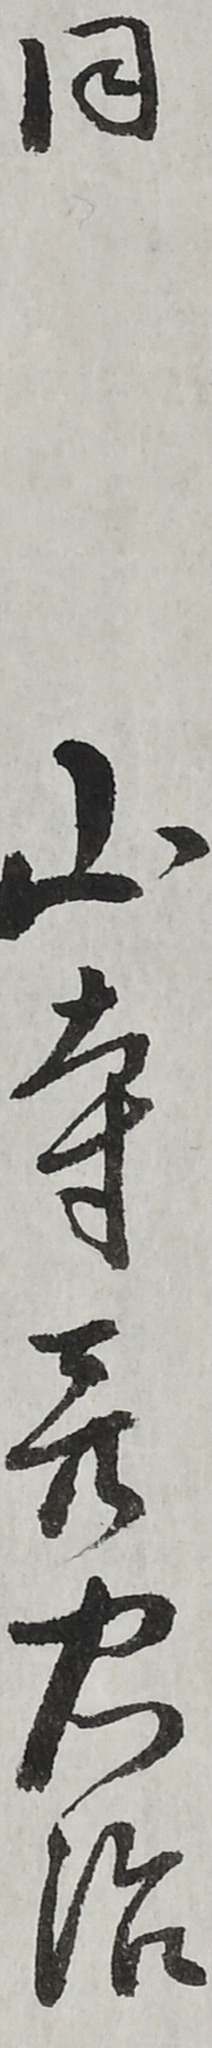同山寺喜忠治
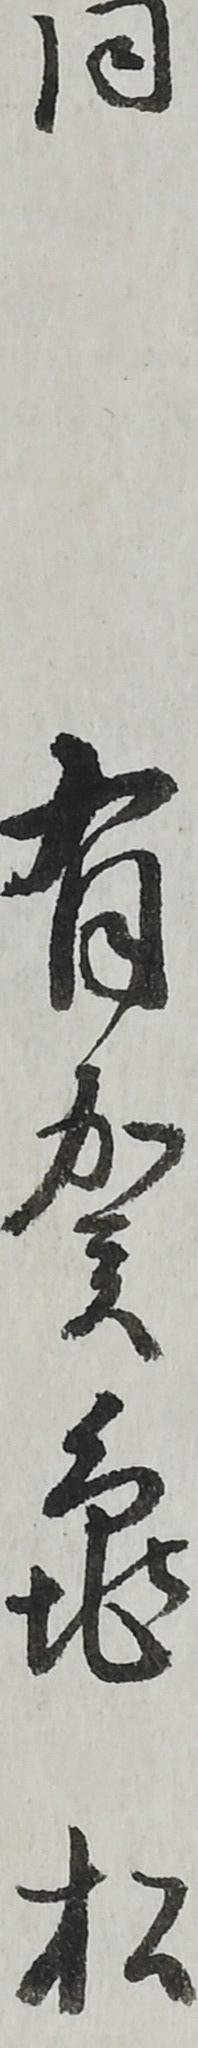同有賀亀松
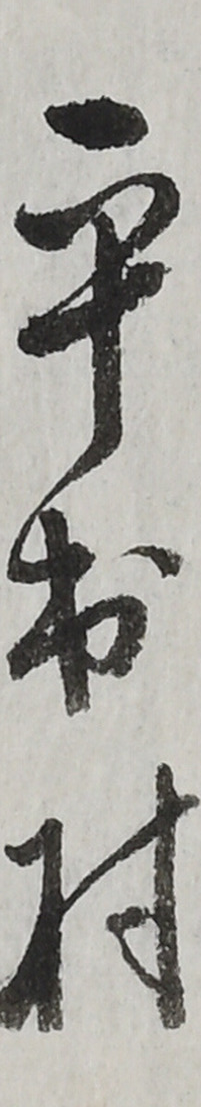平出村
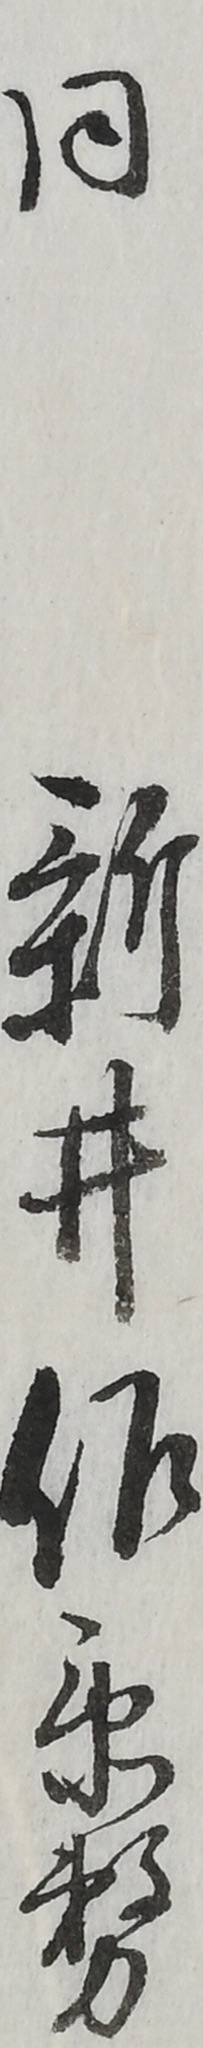同新井作衛勢
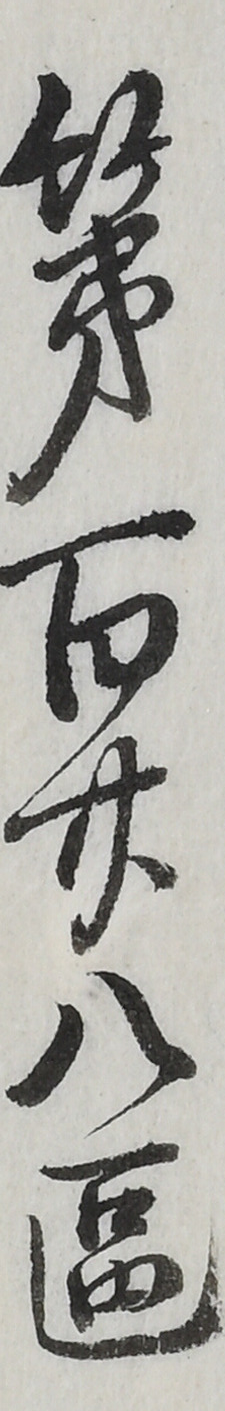第百廿八区
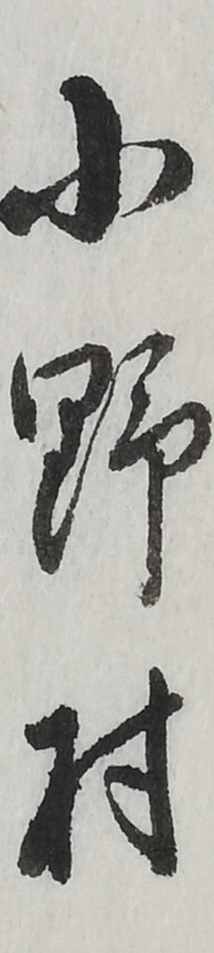小野村
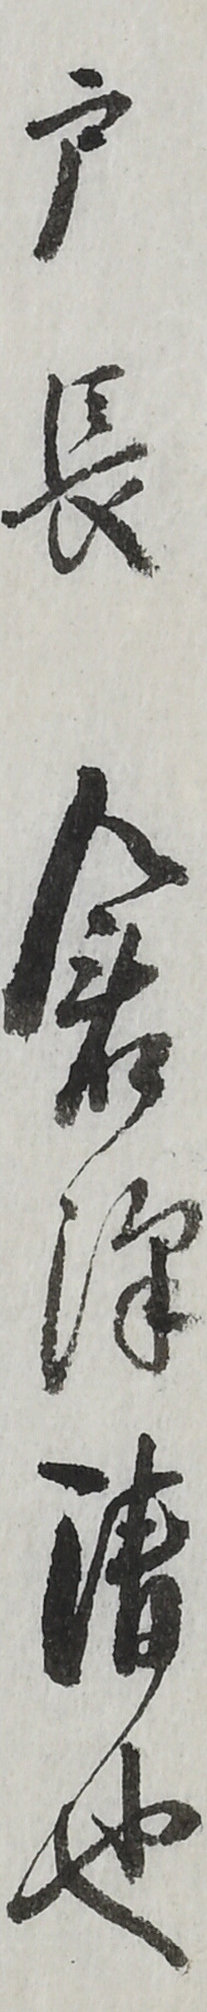戸長倉澤清也
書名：伊那郡毎村戸長副戸長名簿
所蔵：伊那市立高遠町図書館・合同会社AMANE
